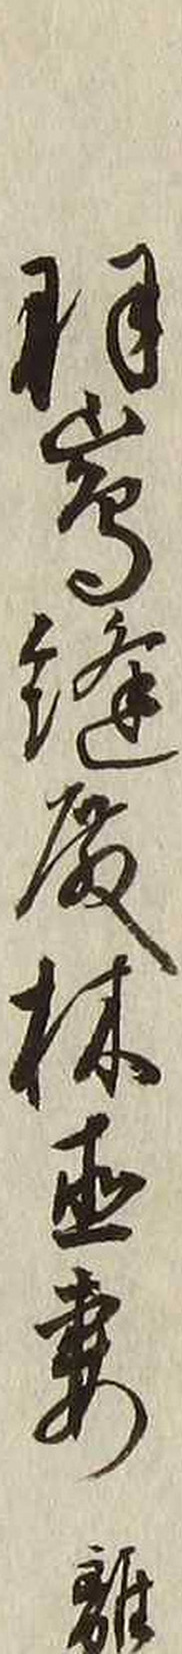女羽嶋縫殿林直妻離別
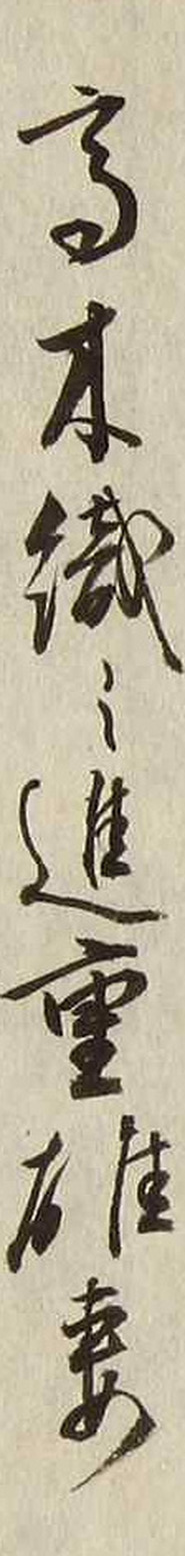高木織之進重雄妻
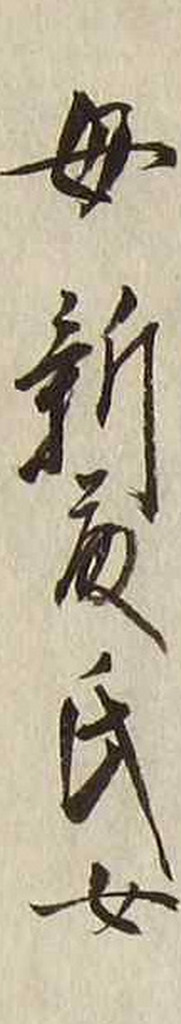母新藤氏女

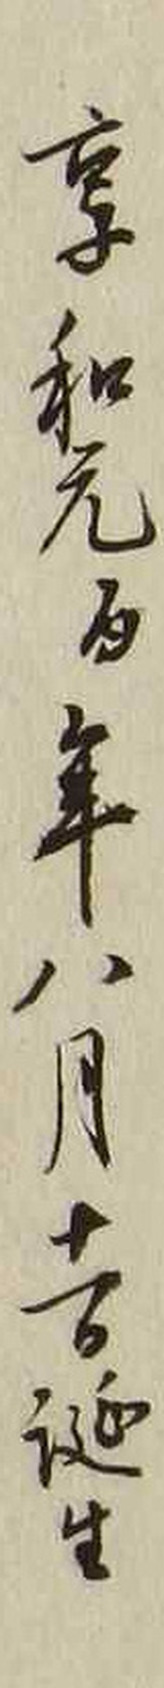享和元酉年八月十一日誕生
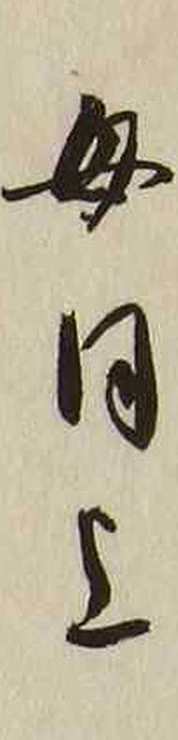母同上
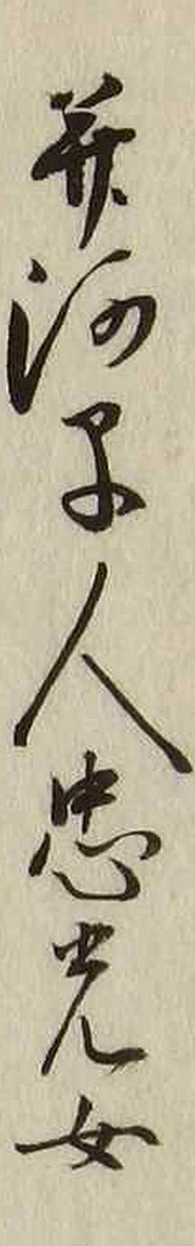并河早人忠光女
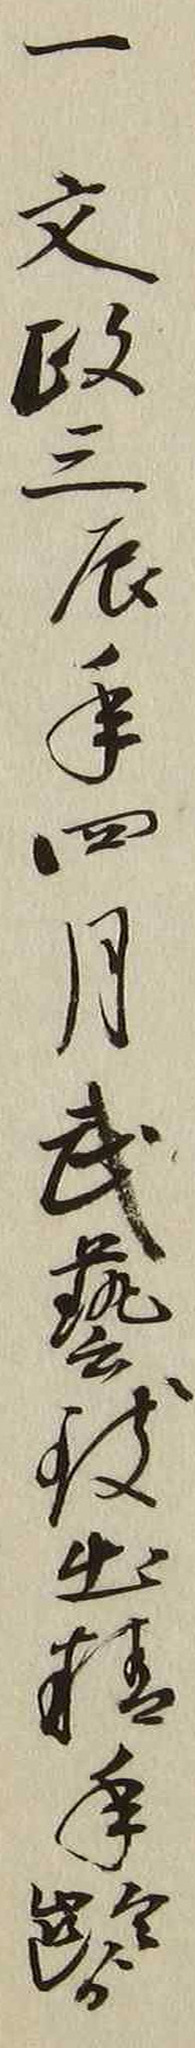一文政三辰年四月武芸致出精年齢ゟ
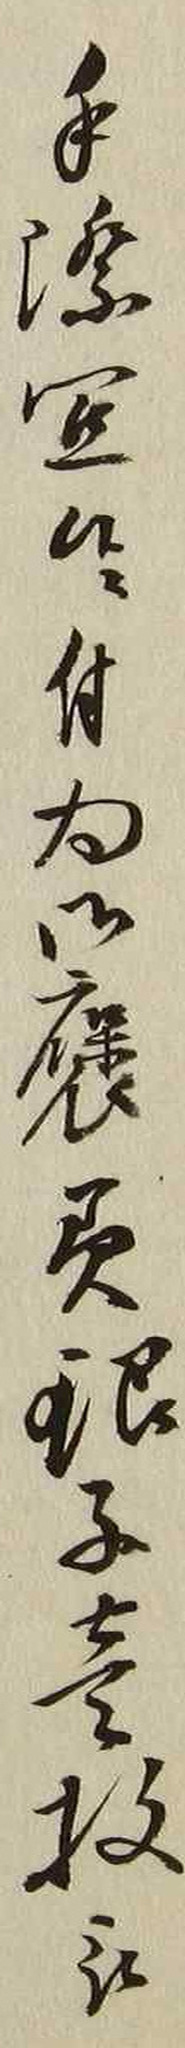手際宜候ニ付為御褒美銀子壱枚被
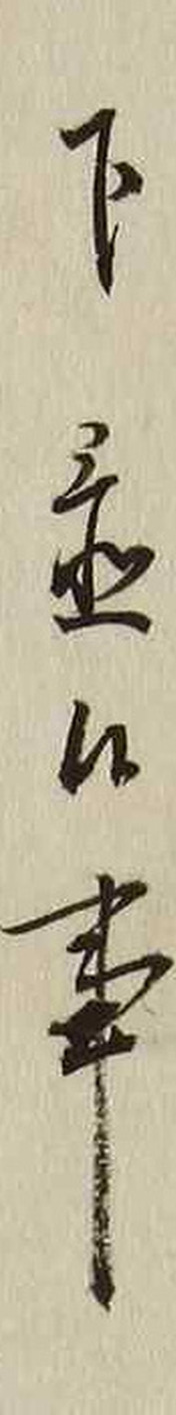下置候事
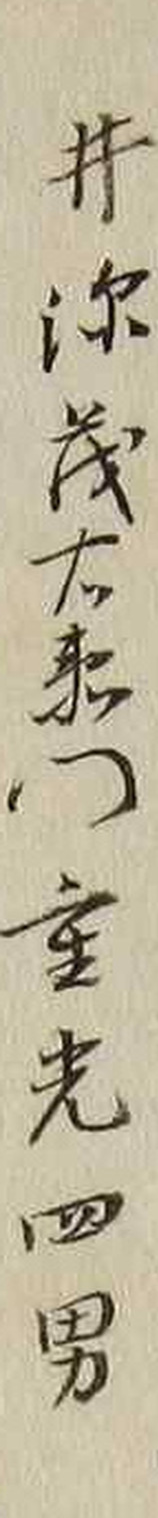井深茂右衛門重光四男
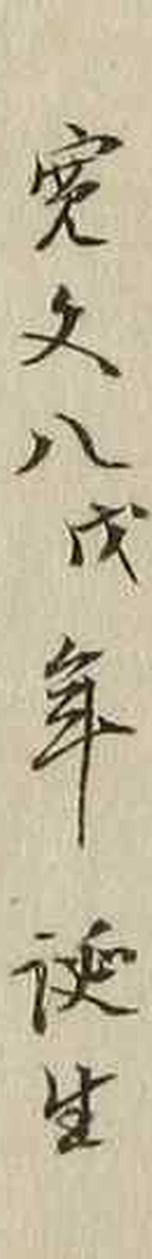寛文八戌年誕生
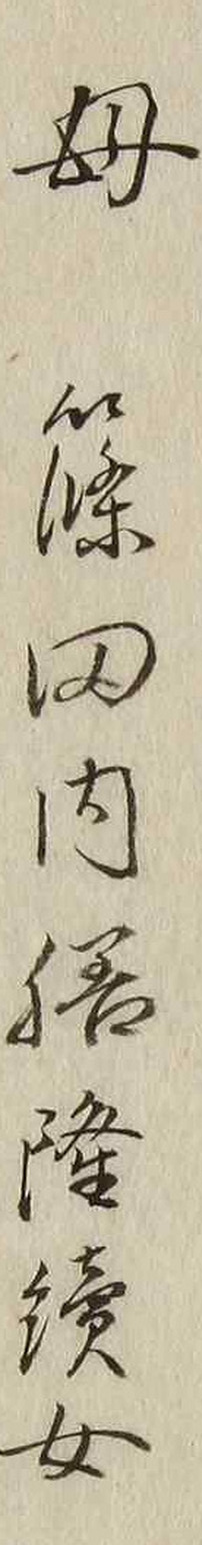母篠田内膳隆続女
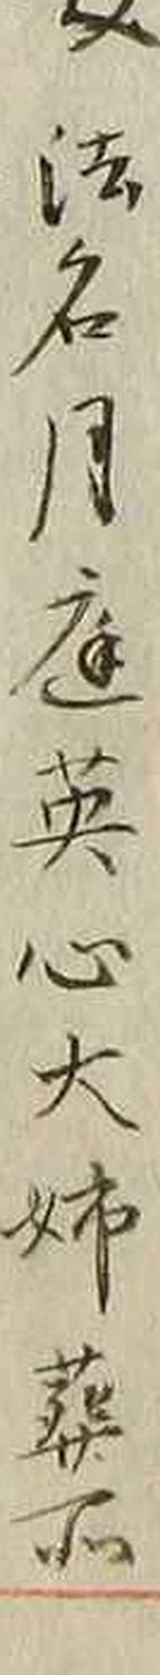法名月庭英心大姉葬所
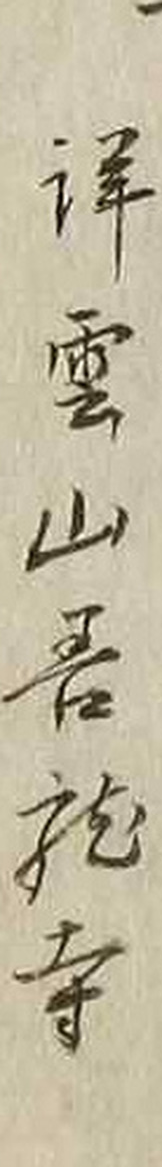詳雲山善龍寺
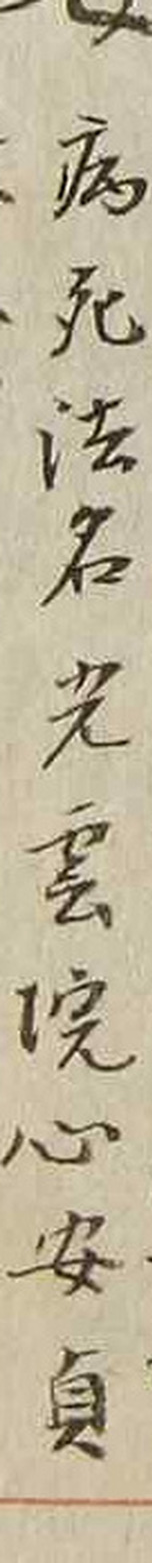病死法名光雲院心安貞
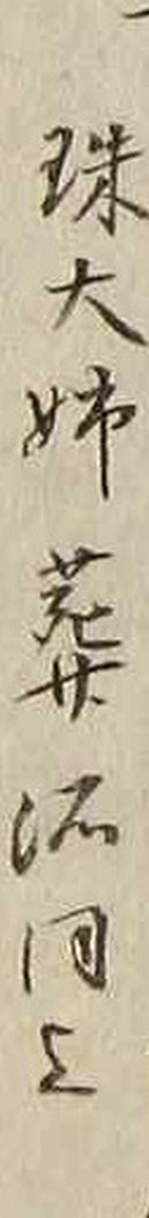珠大姉葬所同上
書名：諸士系譜　巻之22　い之部22
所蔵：会津若松市立会津図書館
